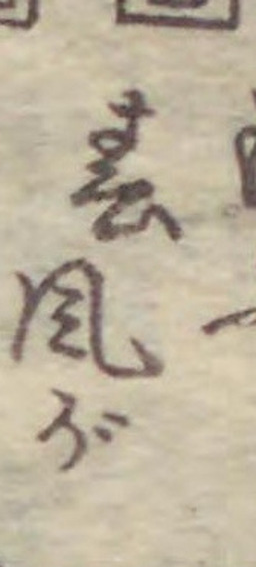春風が
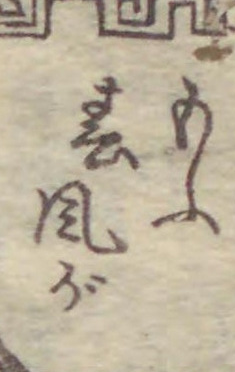春風が
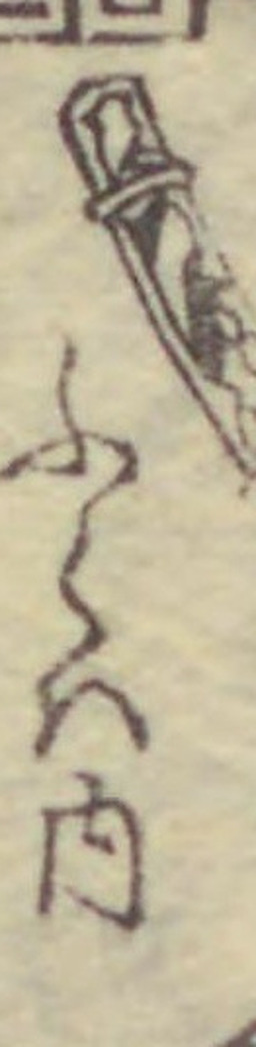ふくは内
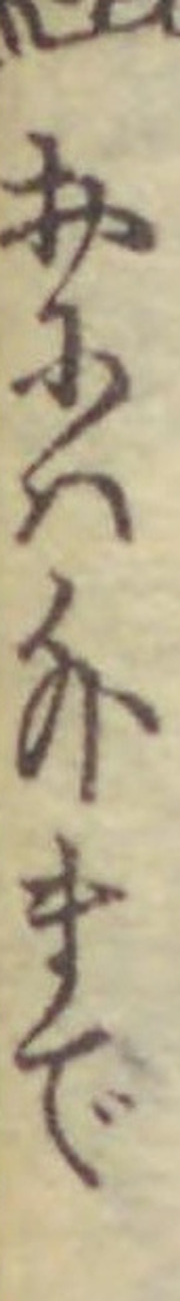おには外まで
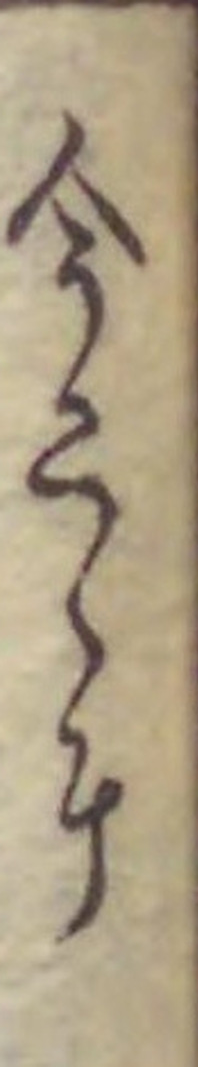今こゝに
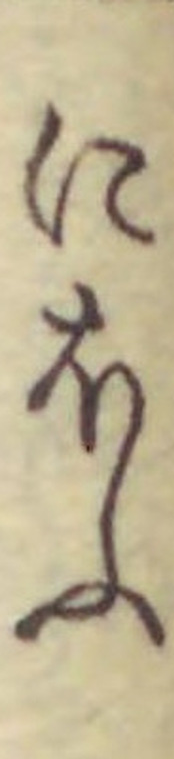にほふ
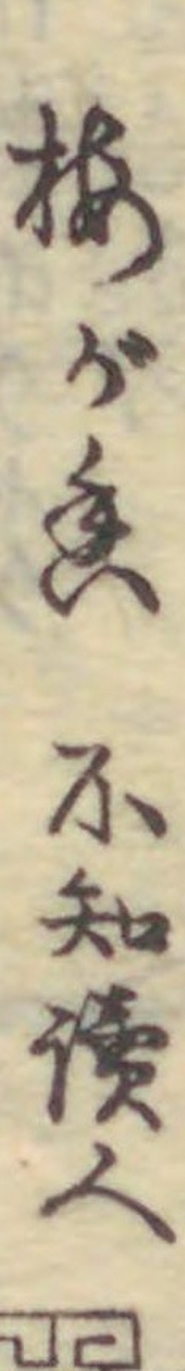梅が香不知読人
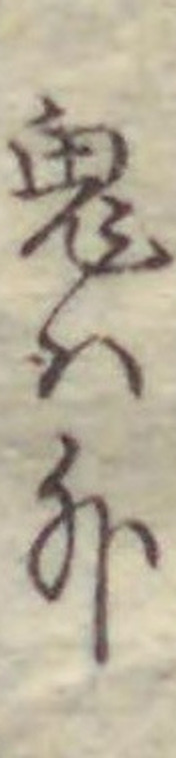鬼は外
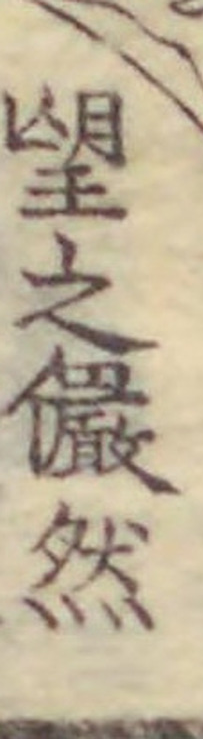望之厳然
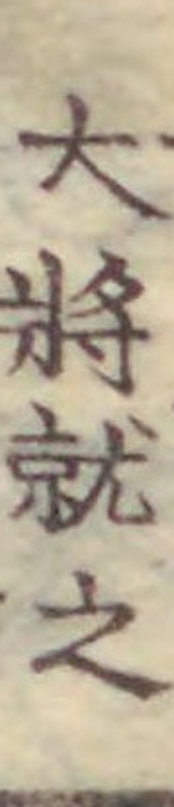大将就之
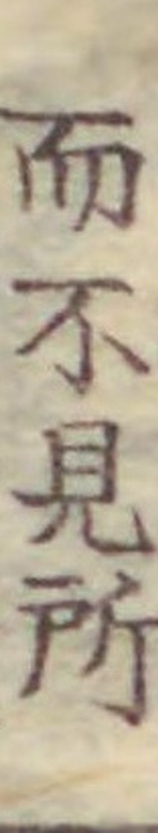而不見所
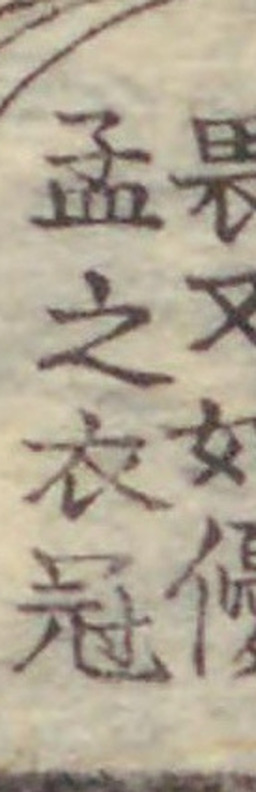孟之衣冠

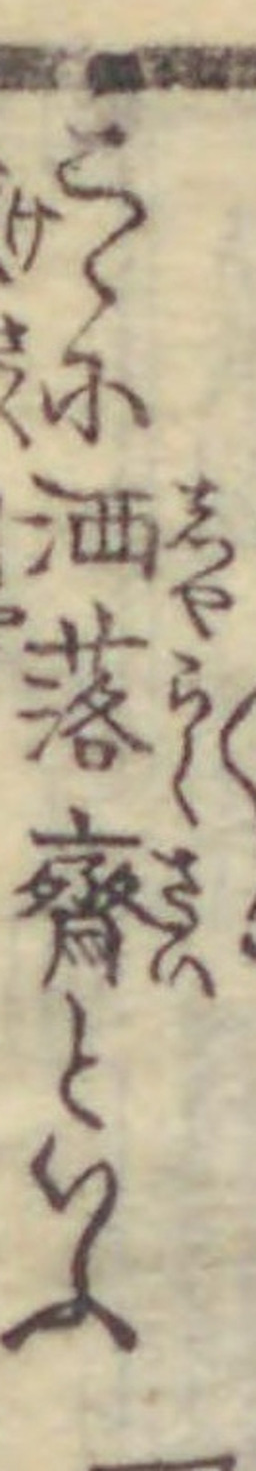ここに洒落斎といふ
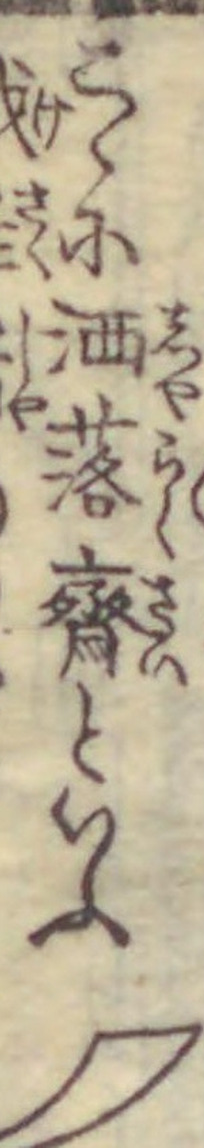ここに洒落斎といふ
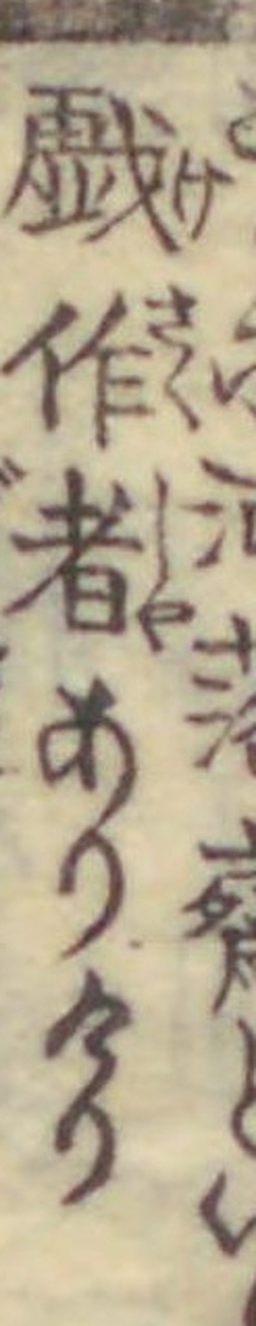戯作者ありけり
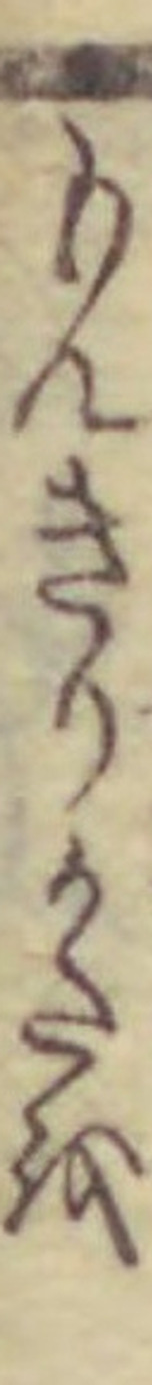もんきりがたを
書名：大時代唐土化物 3巻. 曽我太夫染
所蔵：国立国会図書館 National Diet Library, JAPAN
